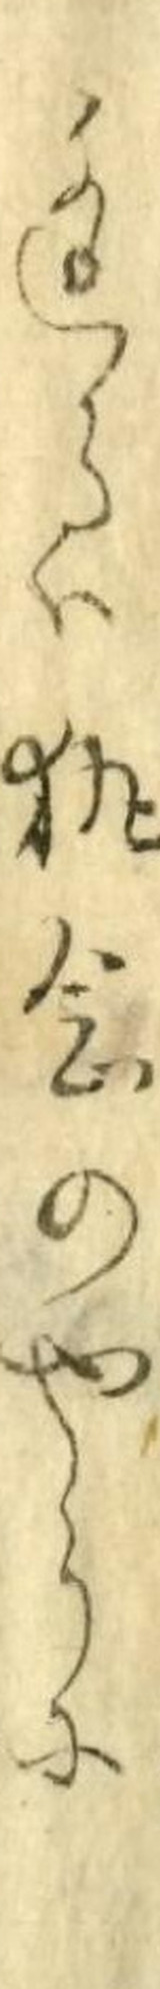逢るは執念のやうに
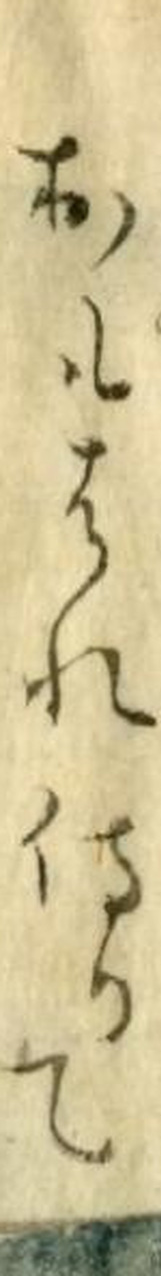おもはれ侍りて
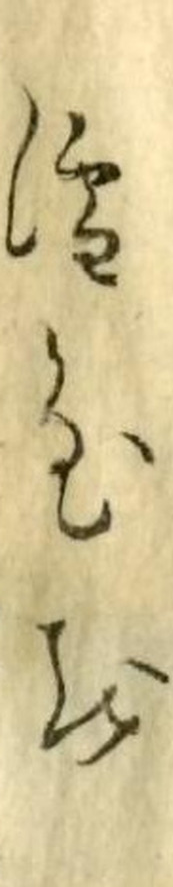濡色を
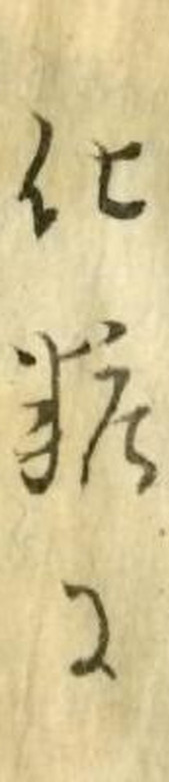化粧に
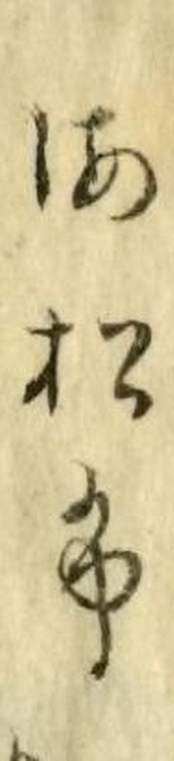海松布

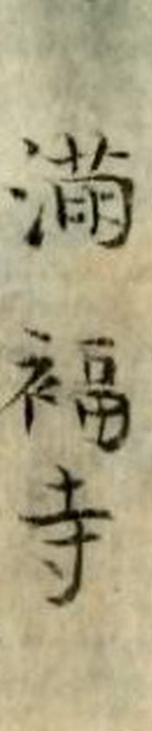満福寺
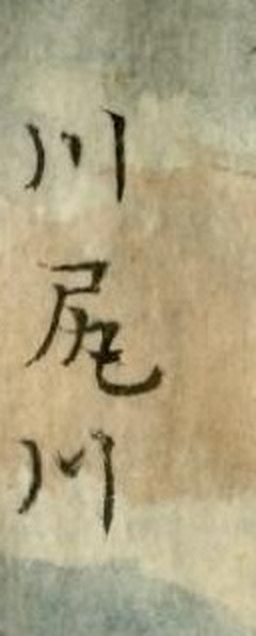川尻川

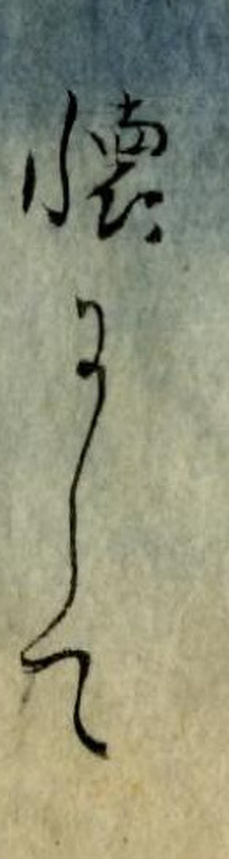懐にして
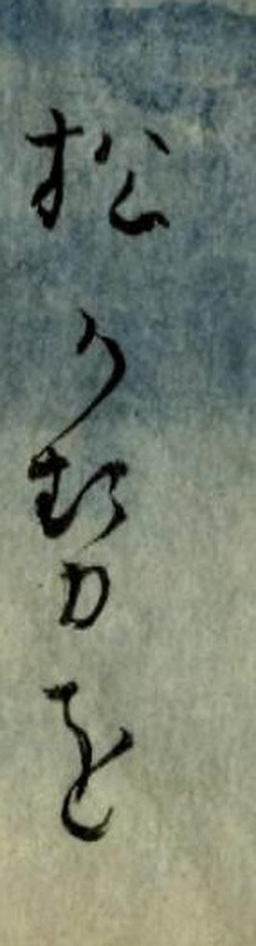松かせを

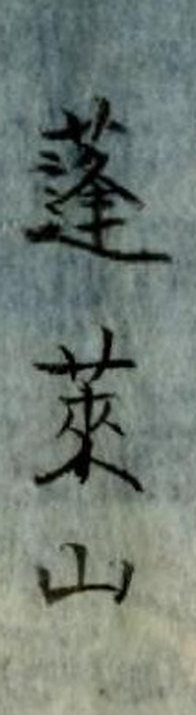蓬莱山
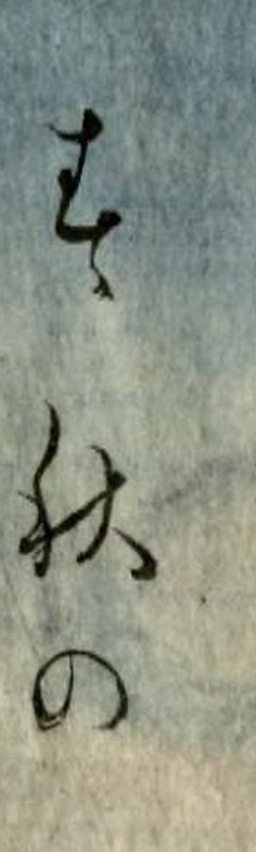春秋の
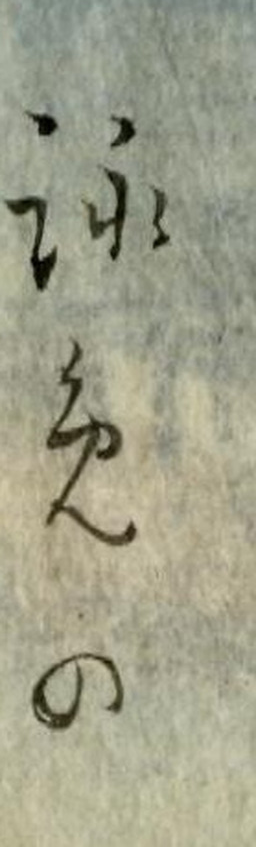詠めの
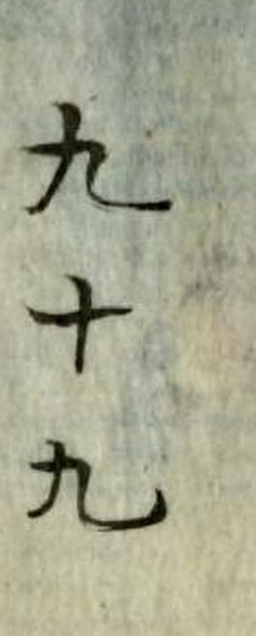九十九

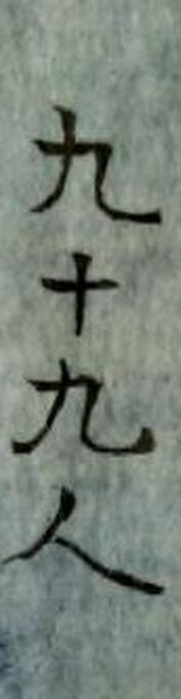九十九人

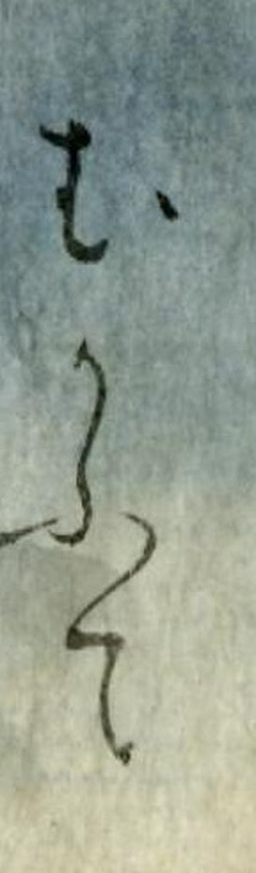むかふて
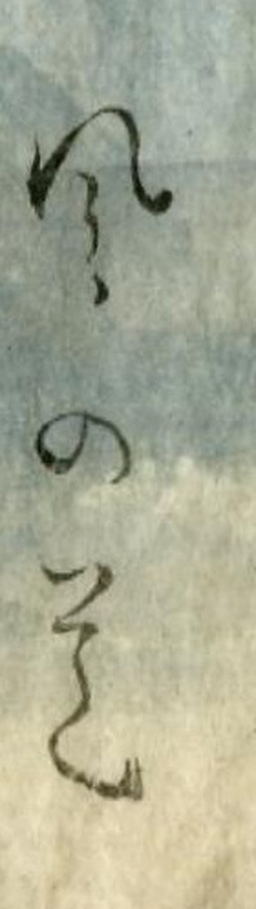風の首
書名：能登めぐり
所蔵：Ishikawa Prefectural Library
